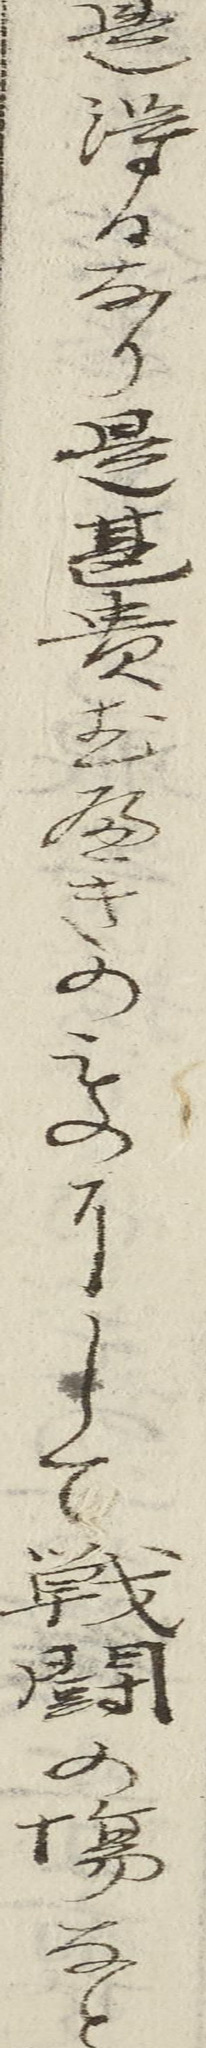是得るなり是甚貴玉へきものにして戦闘場なと
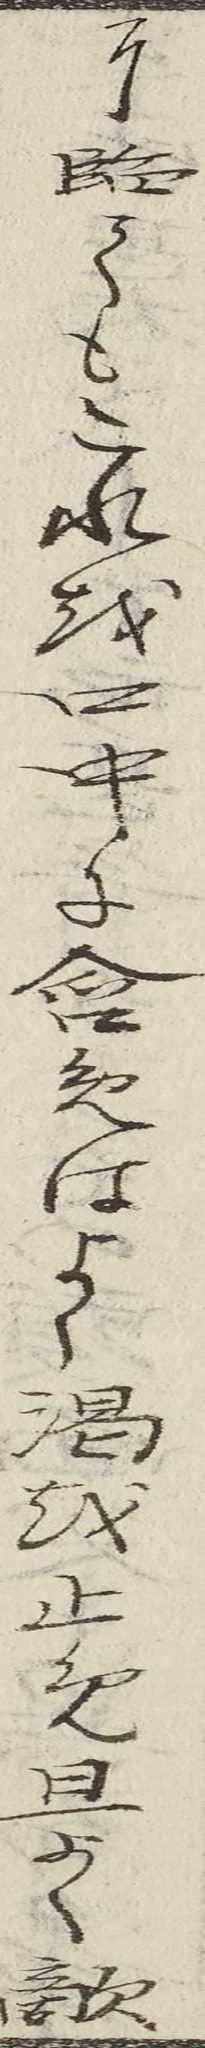に臨てもこれを口中に含めはよく渇を止め且よく敵
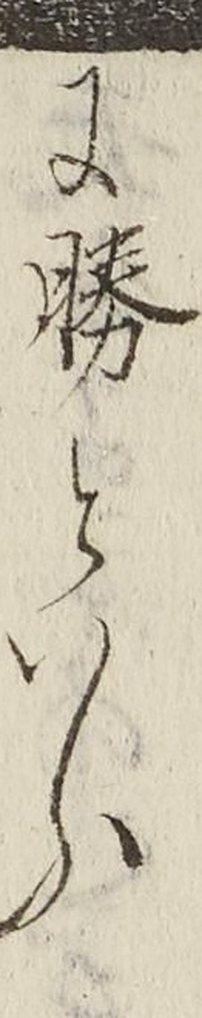に勝といふ
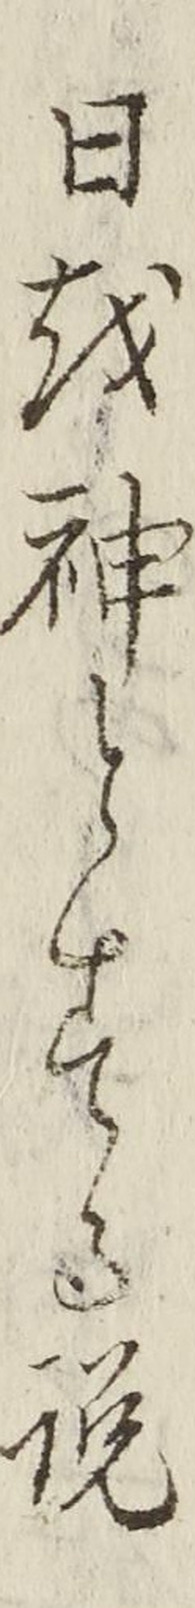日を神とする説
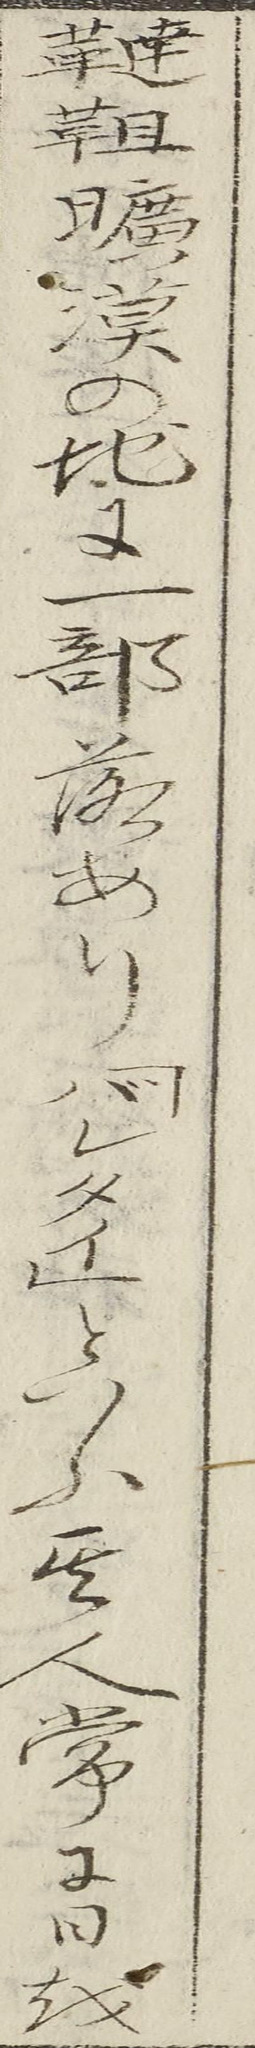韃靼曠漠の地に一部落あり「バレタイ」といふ其人常に日を
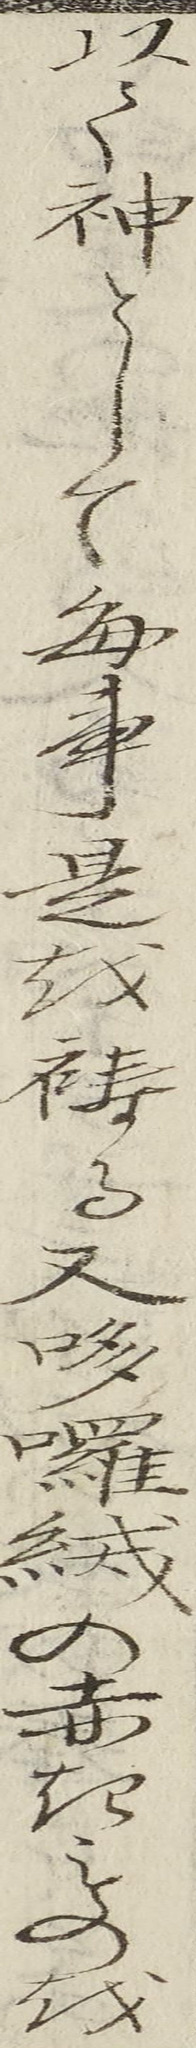以て神として毎事是を祷る又哆囉縅の赤きものを
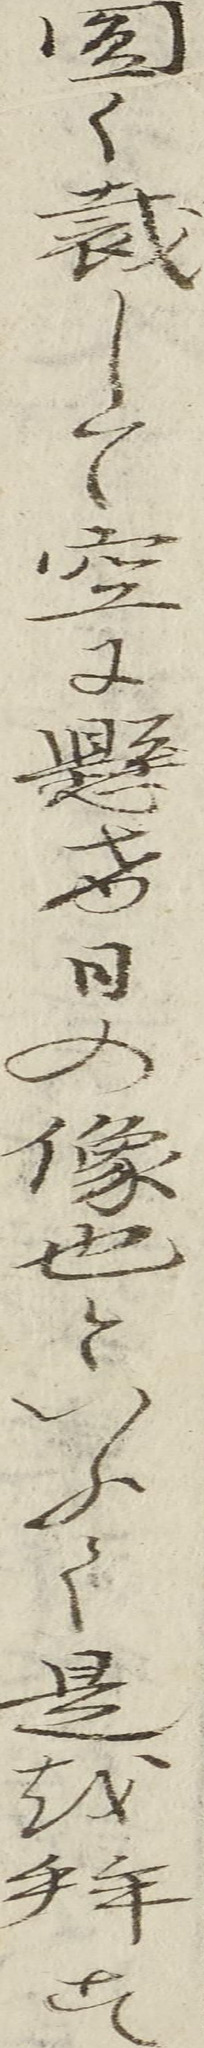円く裁して空に懸け日の像也といふて是を拝す
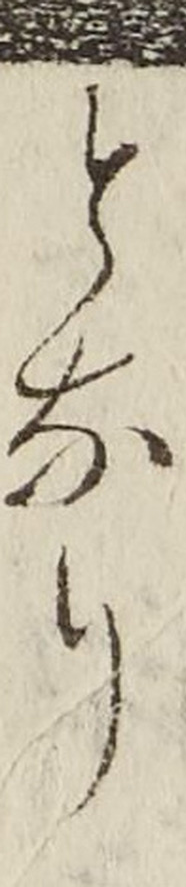となり

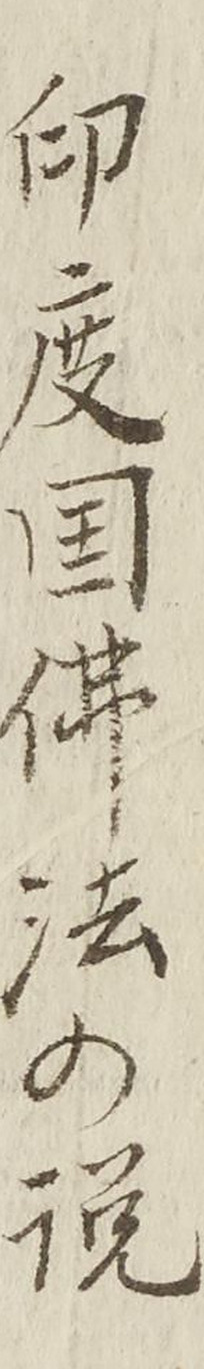印度国仏法の説
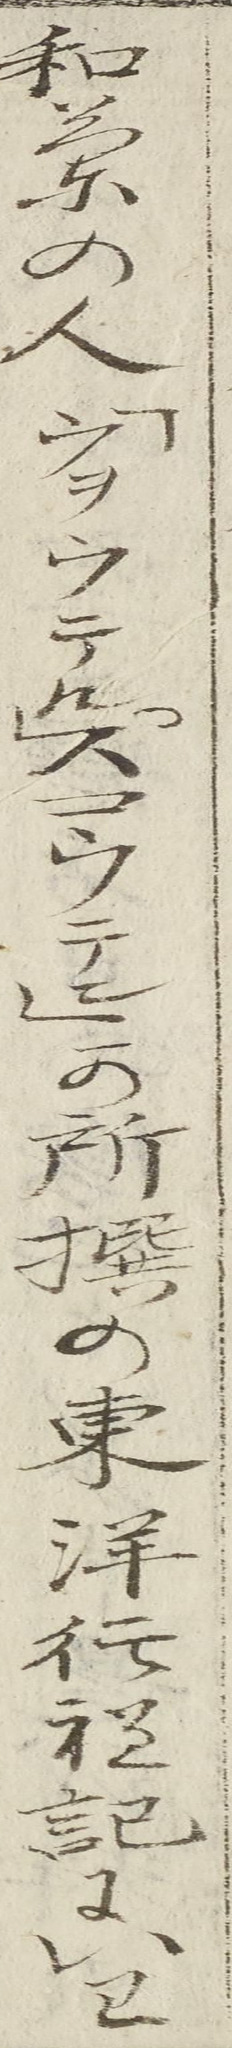和蘭の人「ウヲウテル。スコウテン」か所撰の東洋行程記にいわ
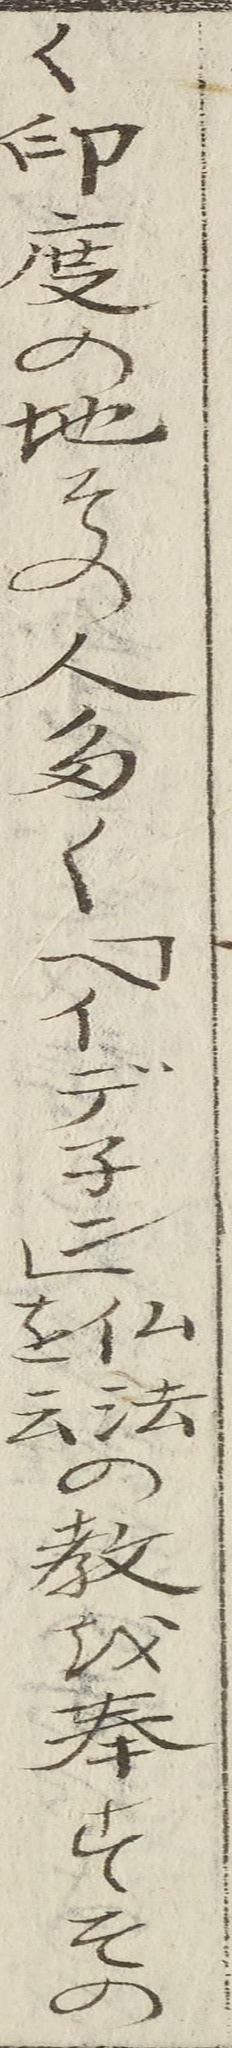く印度の地その人多く「ヘイデ子ン」仏法を云の教を奉すその
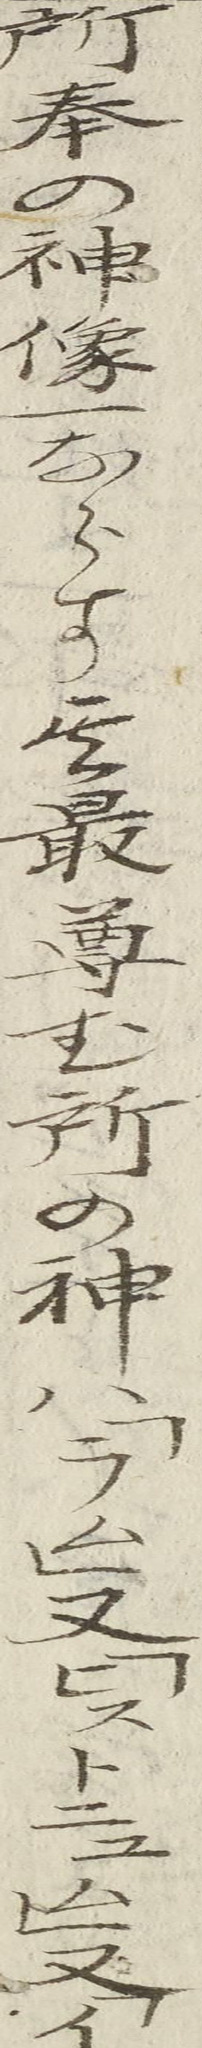所奉の神像一ならす其最尊む所の神ハ「ラム」又「ヒㇲト二ュム」又「イ
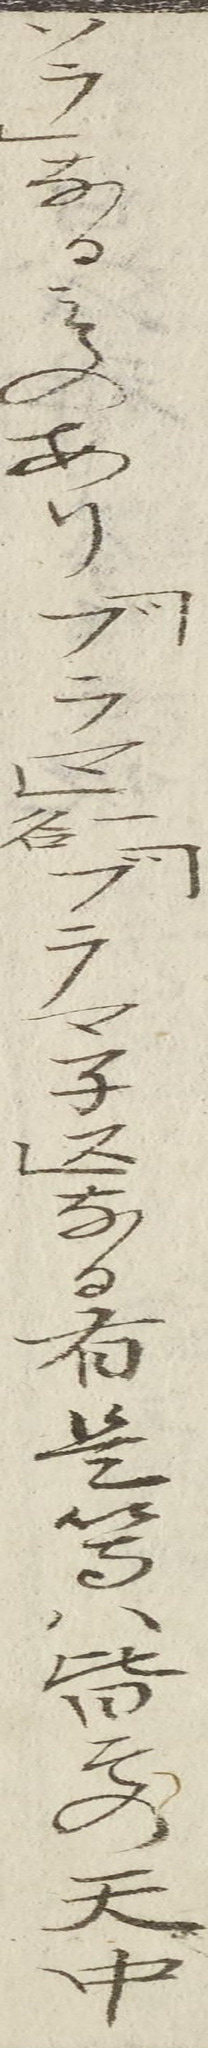ソラ」なるものあり「ブラマ」一名「ブラマ子ス」なる有是等ハ皆その天中
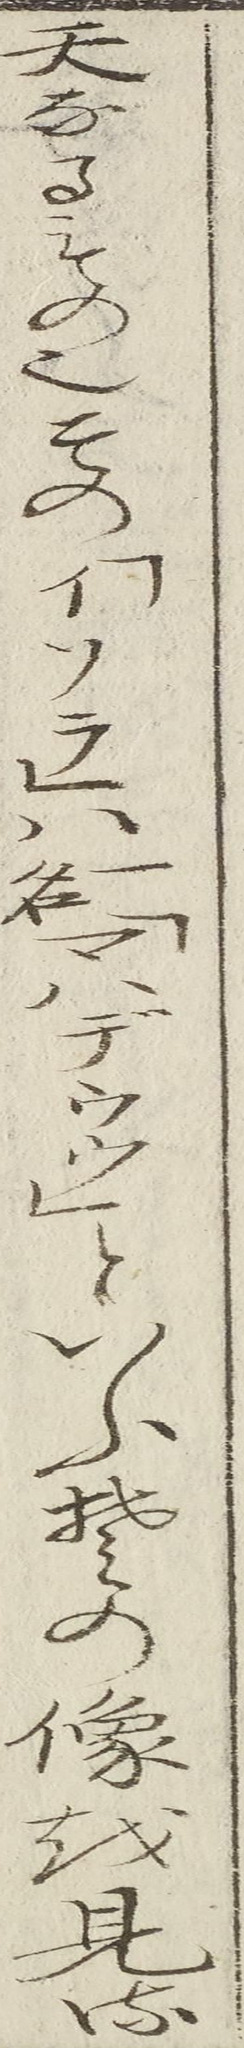天なるもの也その「イソラ」ハ一名マハデウツ」といふその像を見る
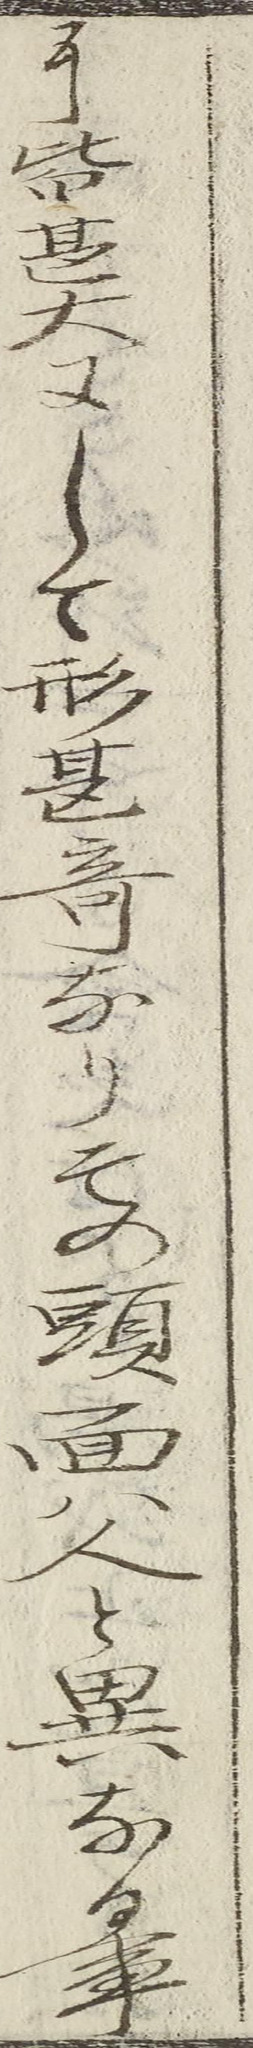に皆甚大にして形甚奇なりその頭面ハ人と異なる事な
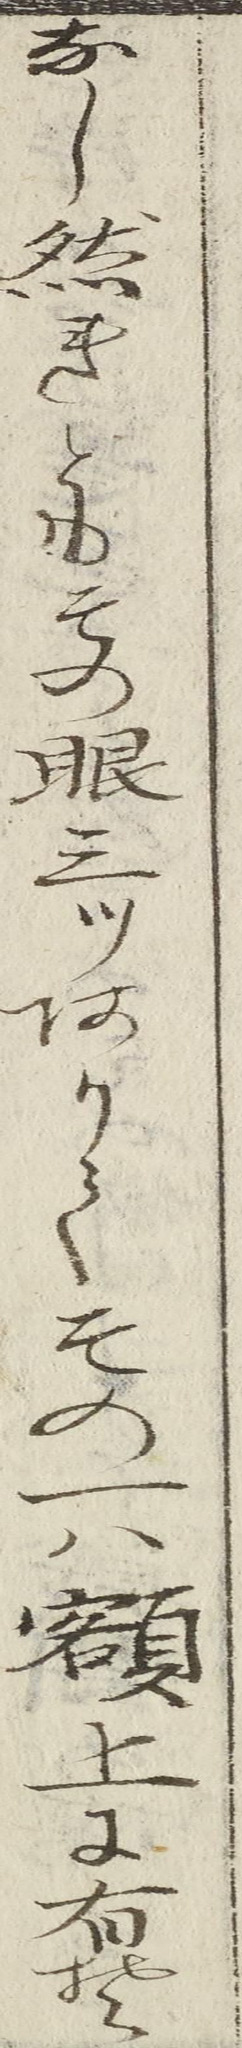なし然れともその眼三ッありてその一ハ額上に有そ
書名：西洋雜記　坤
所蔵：東京大学地震研究所図書室 Earthquake Research Institute Library, The University of Tokyo, JAPAN
